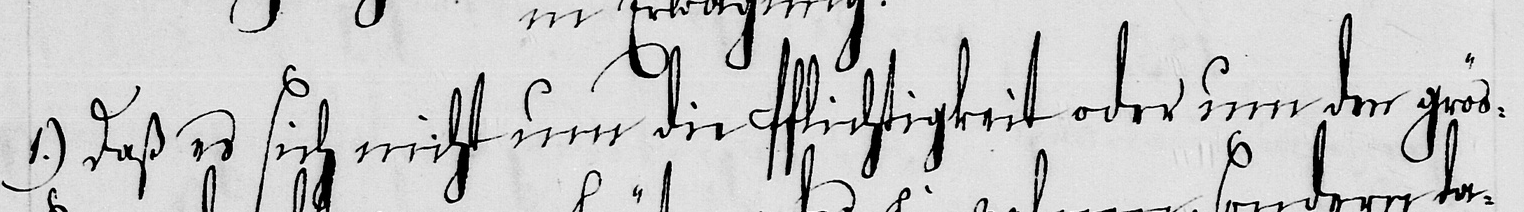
1.) Daß es sich nicht um die Pflichtigkeit oder um den grö¬
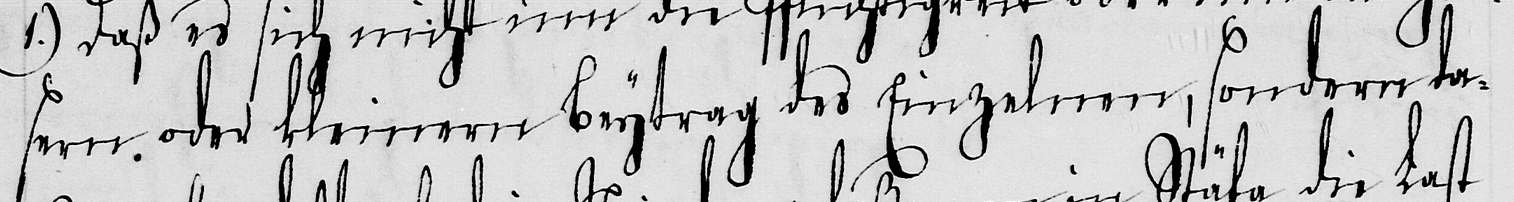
ßern oder kleinern Beytrag des Einzelnen, sondern da¬
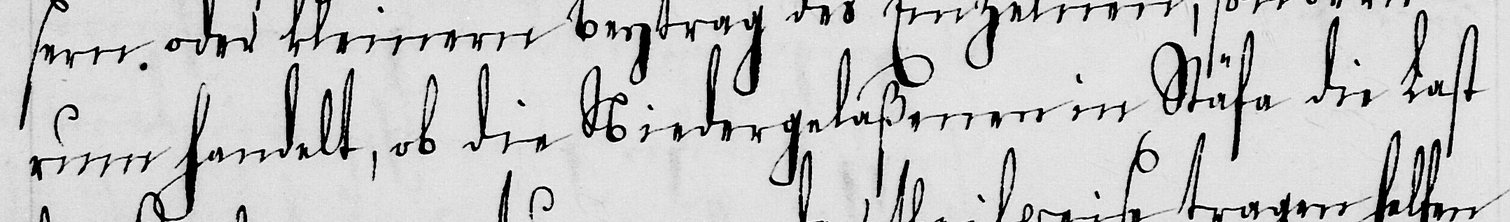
rum handelt, ob die Niedergelaßenen in Stäfa die Last
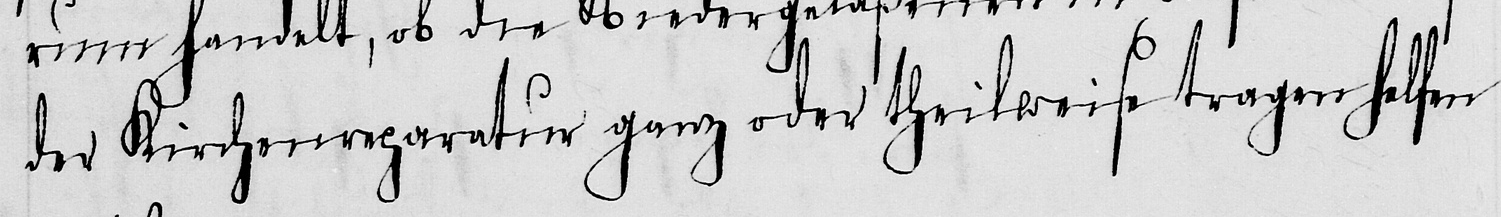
der Kirchenreparatur ganz oder theilweise tragen helfen
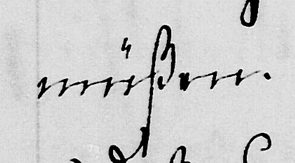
müßen.
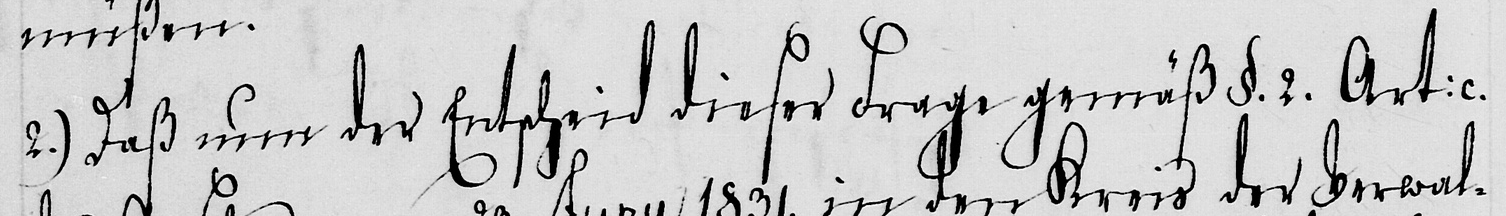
2.) Daß nun der Entscheid dieser Frage gemäß §. 2. Art:
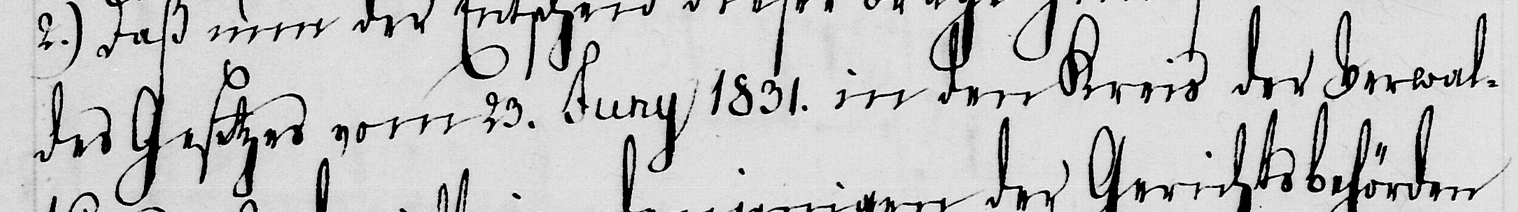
des Gesetzes vom 23. Juny 1831. in den Kreis der Verwal¬
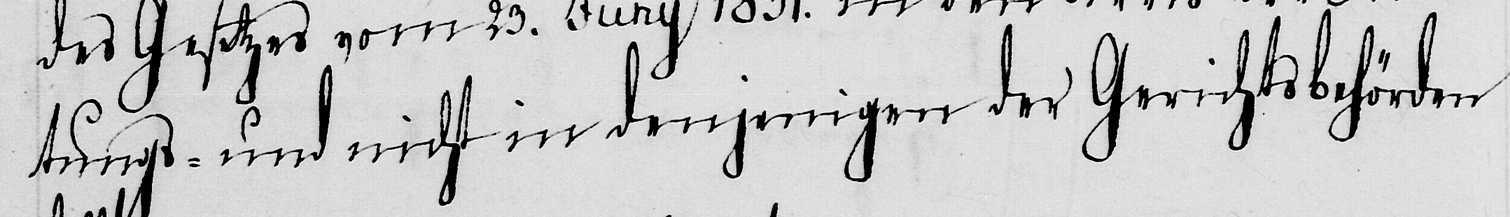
tungs- und nicht in denjenigen der Gerichtsbehörden
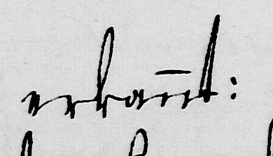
erkannt:
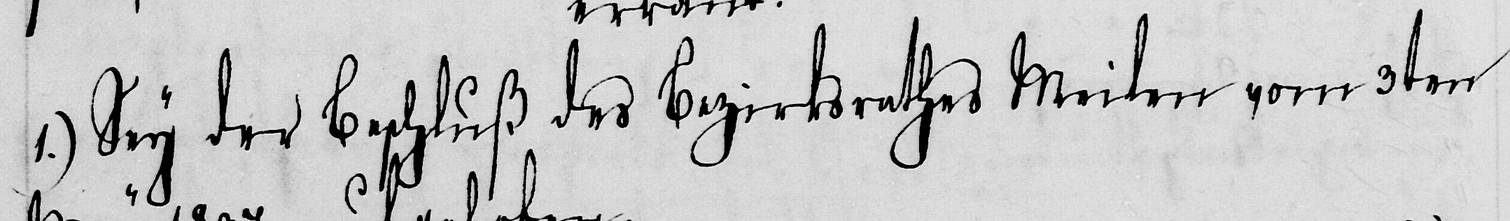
1.) Sey der Beschluß des Bezirksrathes Meilen vom 3ten
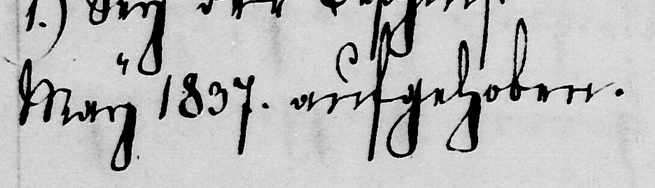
May 1837. aufgehoben.
